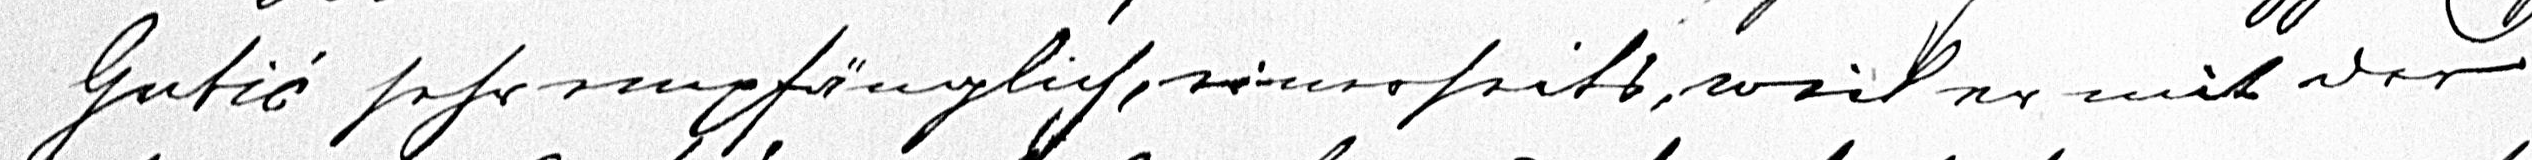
Gubić sehr empfänglich, einerseits, weil er mit der
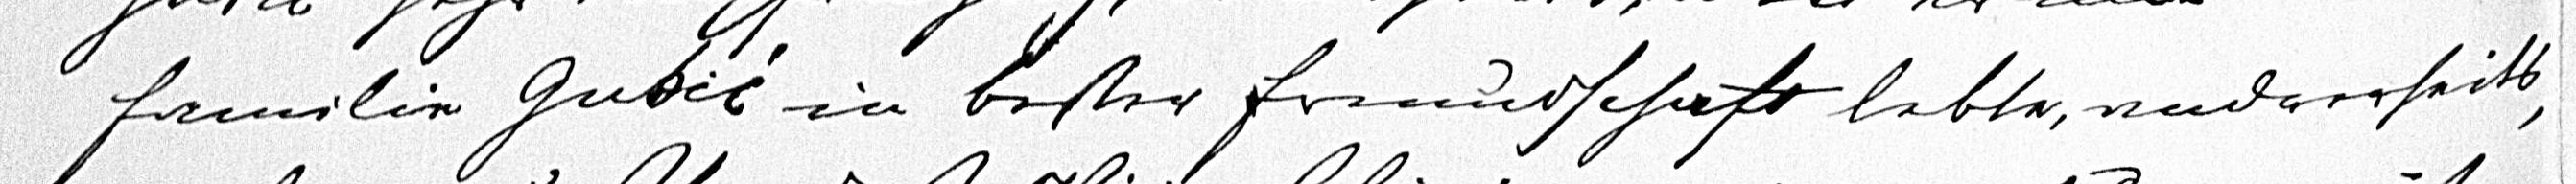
Familie Gubić in bester Freundschaft lebte, anderrseits,
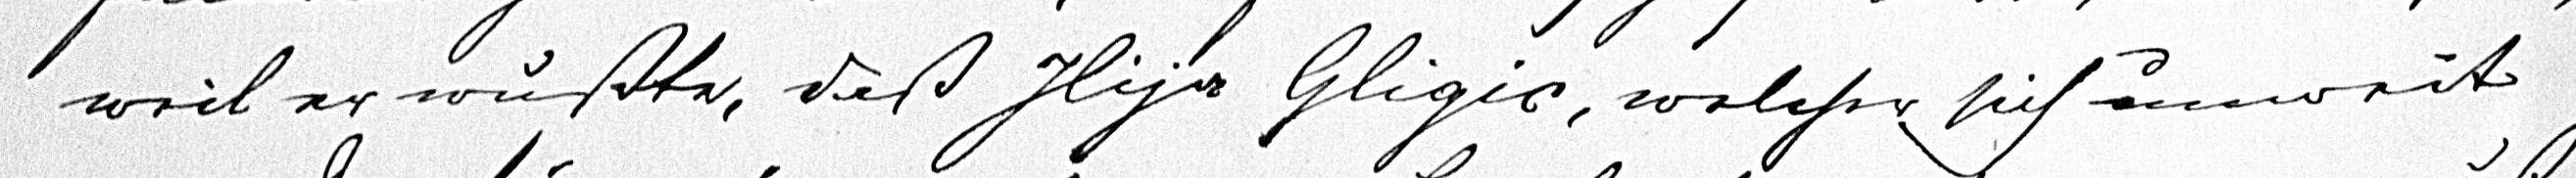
weil er wußte, daß Ilija Gligić, welcher sich unweit
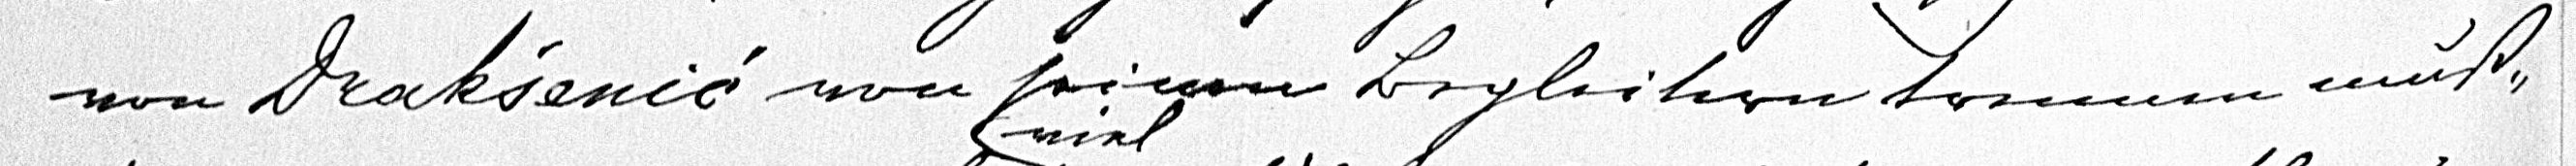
von Drakšenić von seinen Begleitern trennen muß¬
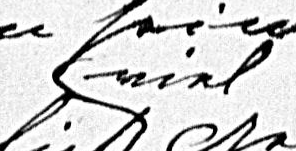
viel
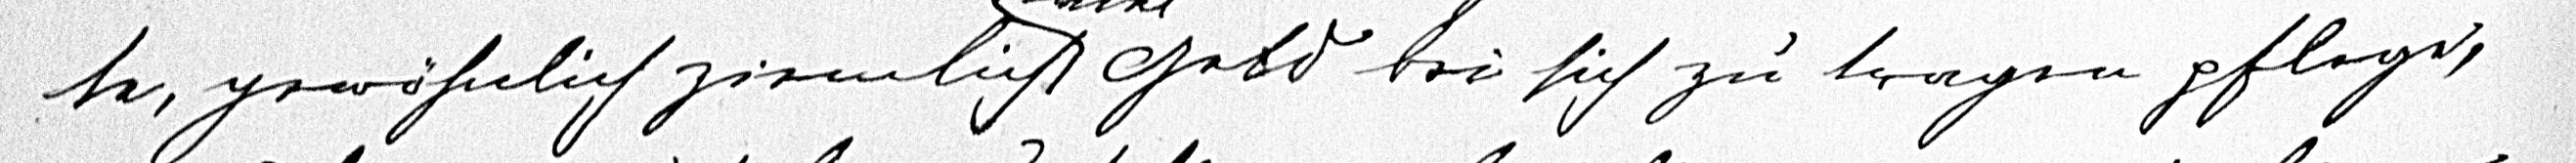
te, gewöhnlich ziemlich Geld bei sich zu tragen pflege,
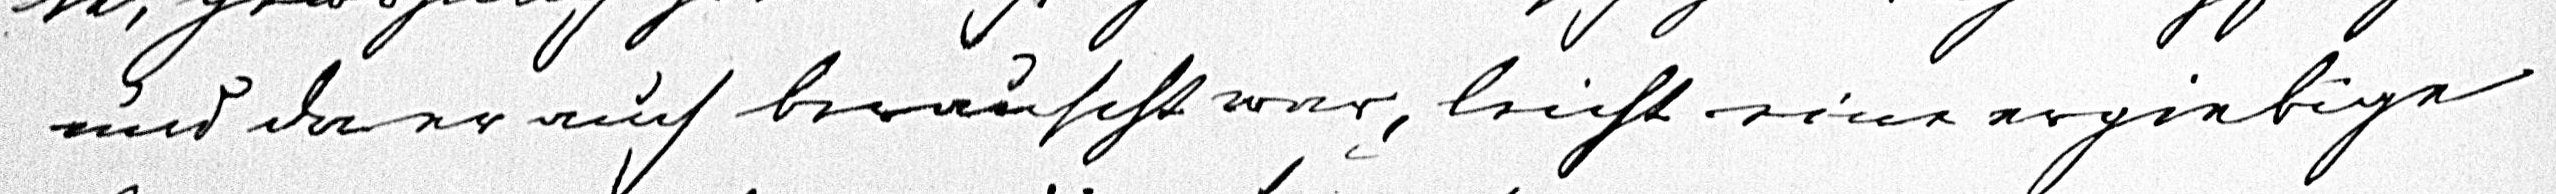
und da er auch berauscht war, leicht eine ergiebige
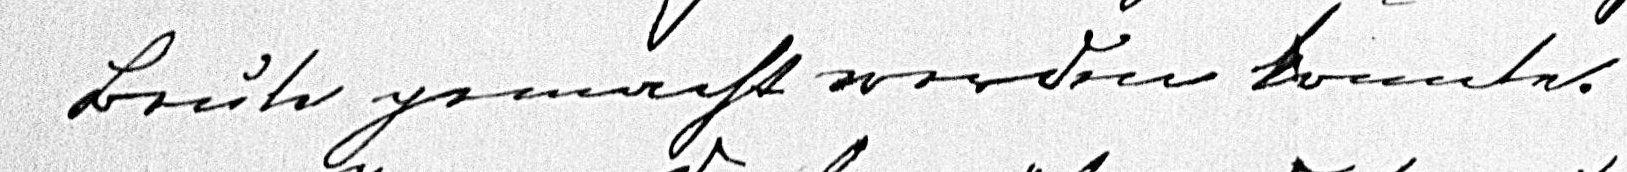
Beute gemacht werden konnte.
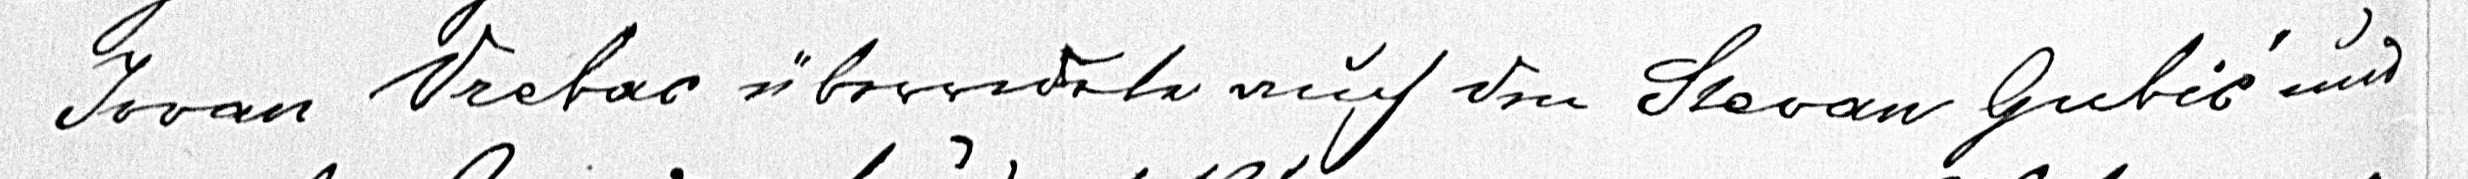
Jovan Vrebac überredete auch den Stevan Gubić und
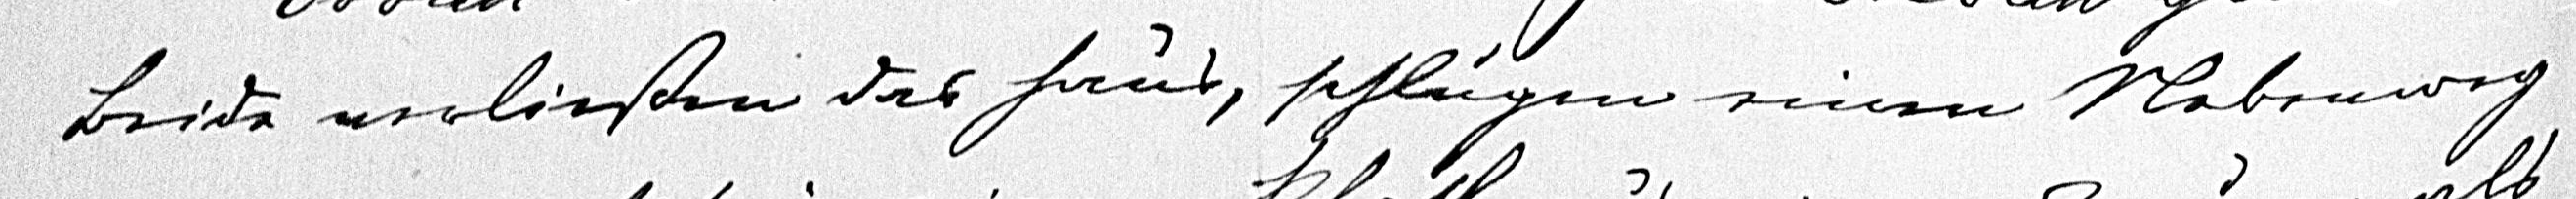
Beide verließen das Haus, schlugen einen Nebenweg
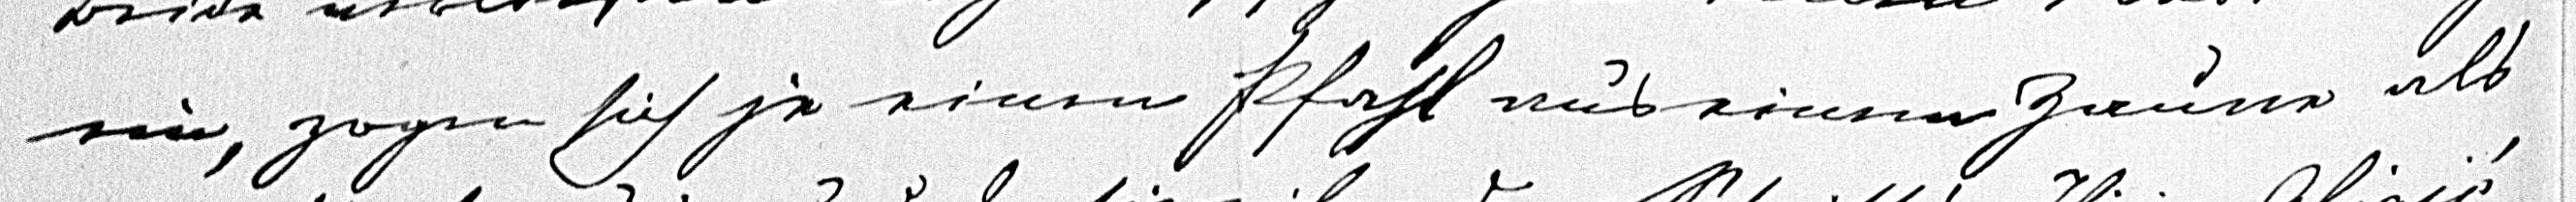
sie, zogen sich je einen Pfahl aus einem Zaune als
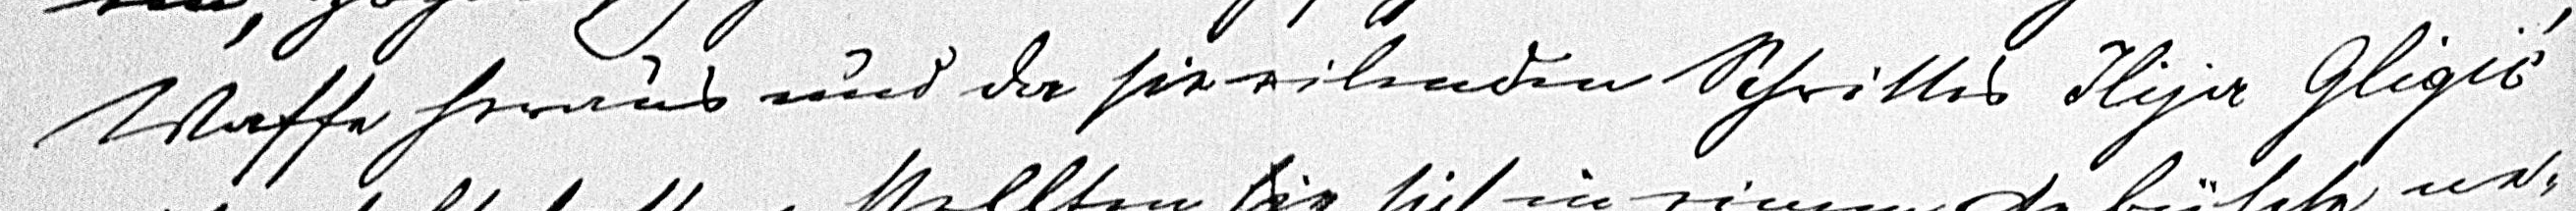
Waffe heraus und da sie eilenden Schrittes Ilija Gligić
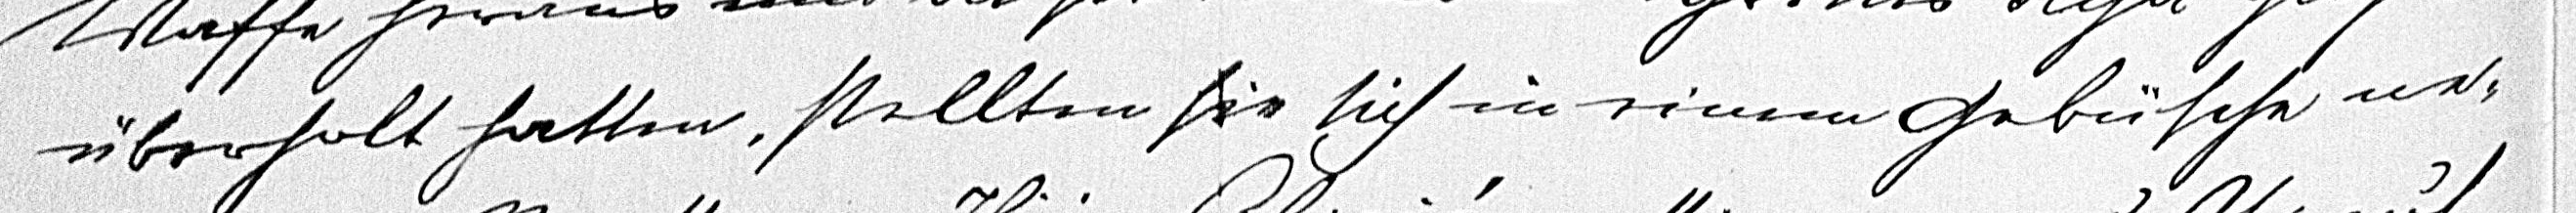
überholt hatten, stellten sie sich in einem Gebüsche ne¬
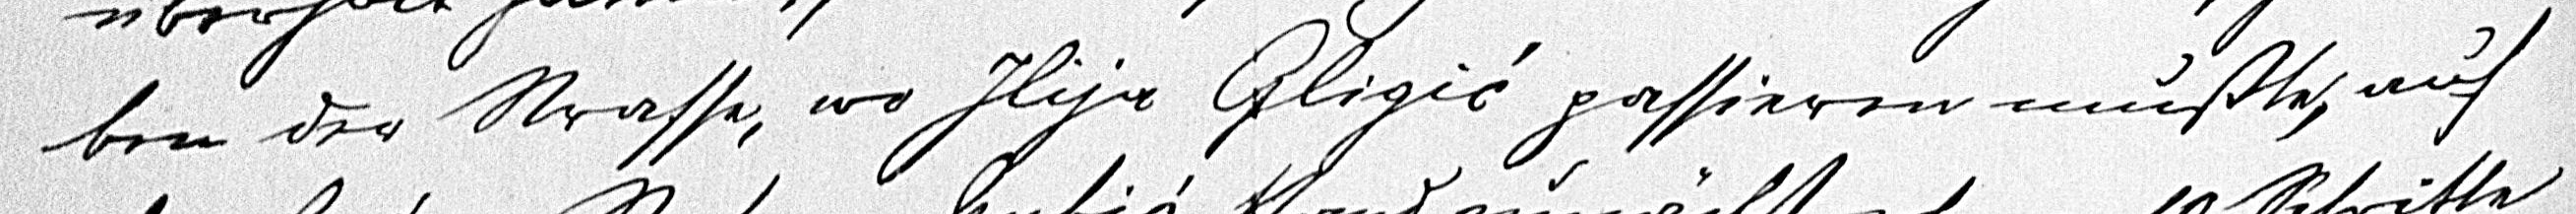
ben der Straffe, wo Ilija Gligić passieren mußte, auf
